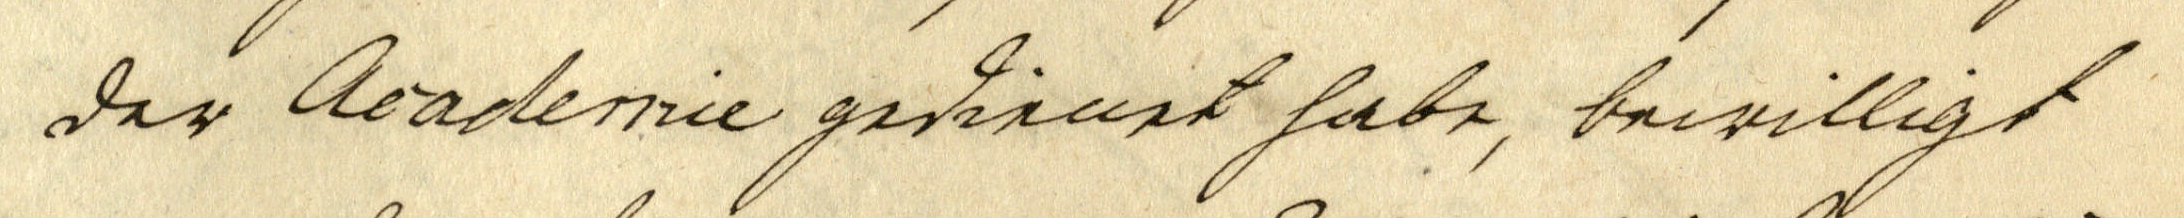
der Academie gedienet habe, bewilligt
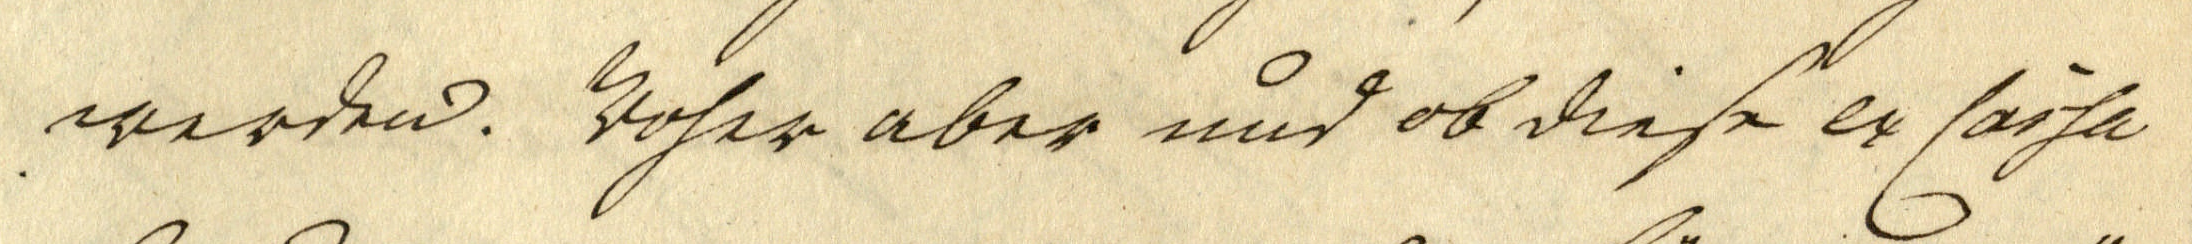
werden. Woher aber und ob diese ex Cassa
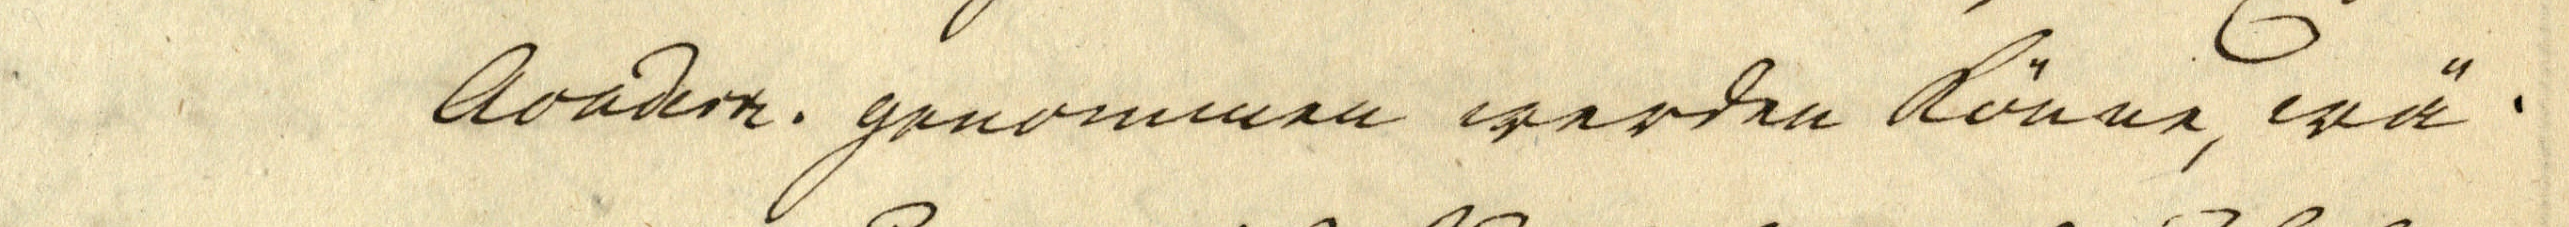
Academ. genommen werden könne, wä-
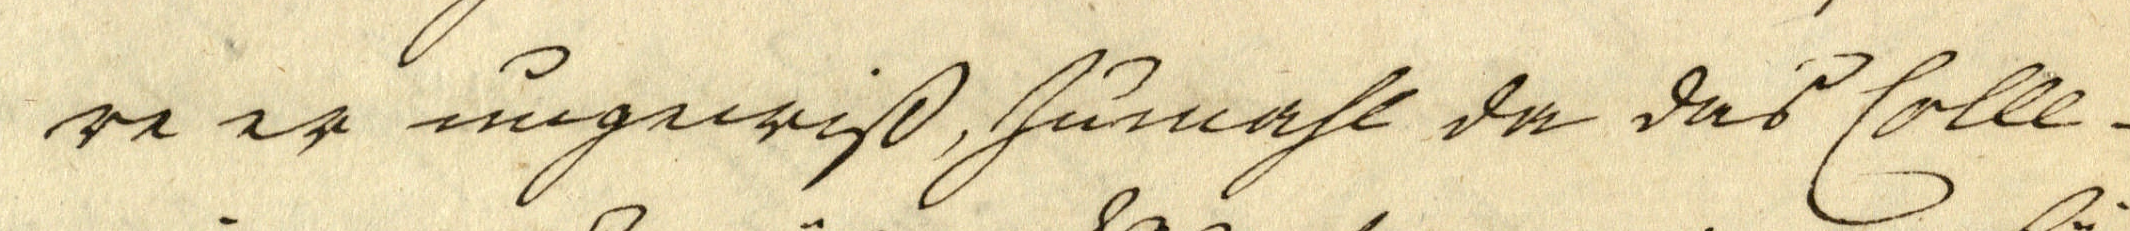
re er ungewiß, zumahl da das Colle-
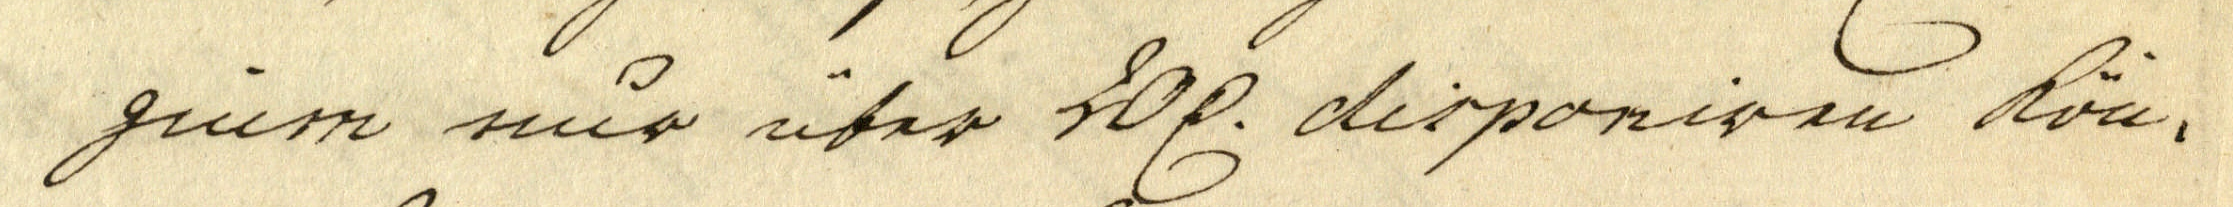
gium nur über 20 rtl. disponiren kön-
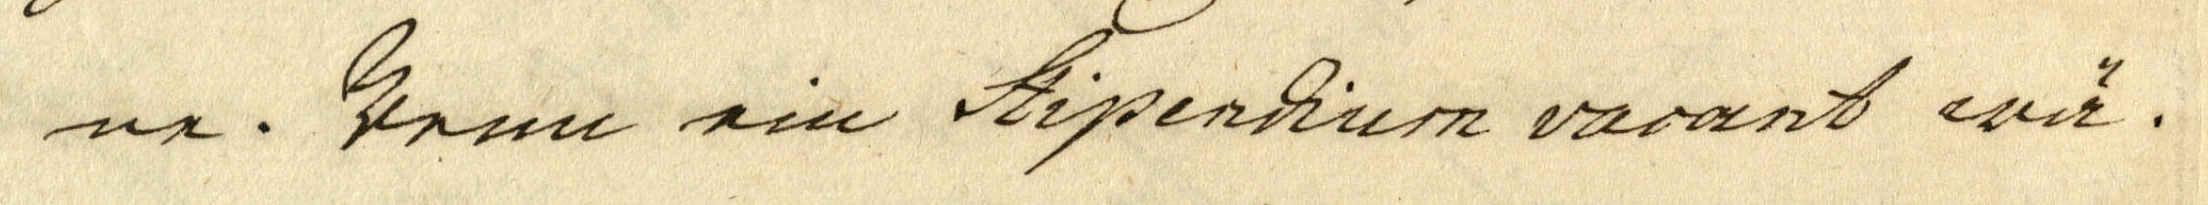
ne. Wenn ein Stipendium vacant wä-
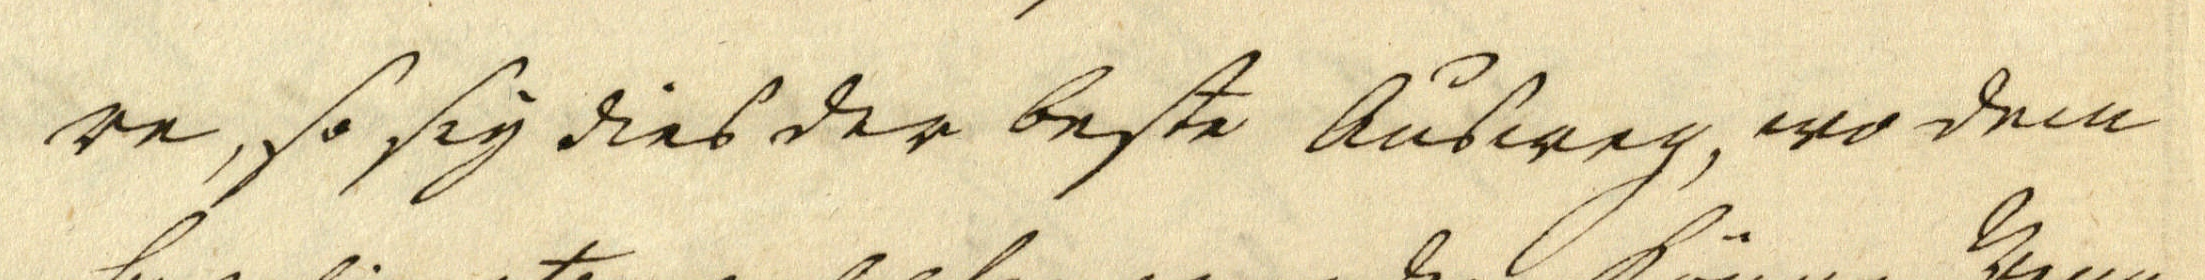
re, so sey dies der beste Ausweg, wo dem
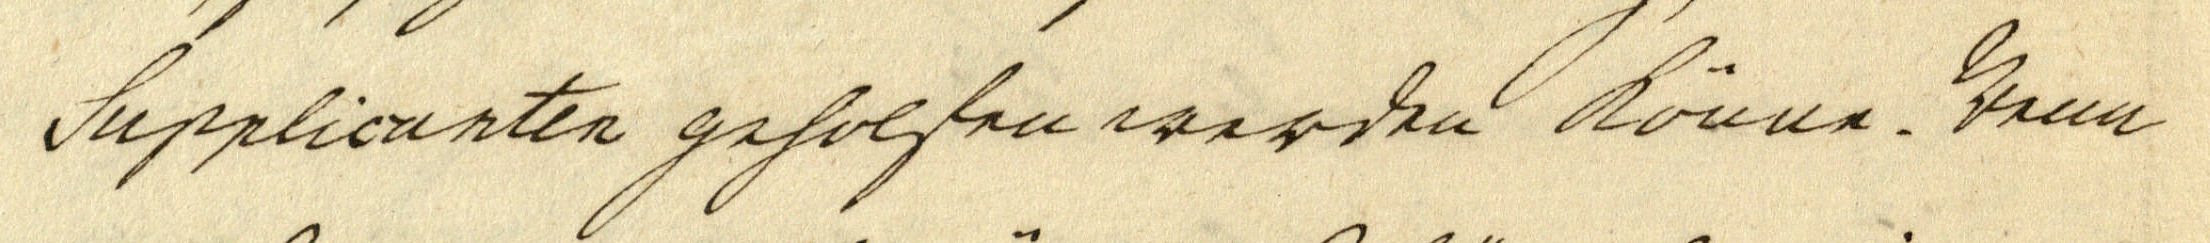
Supplicanten geholfen werden könne. Wenn
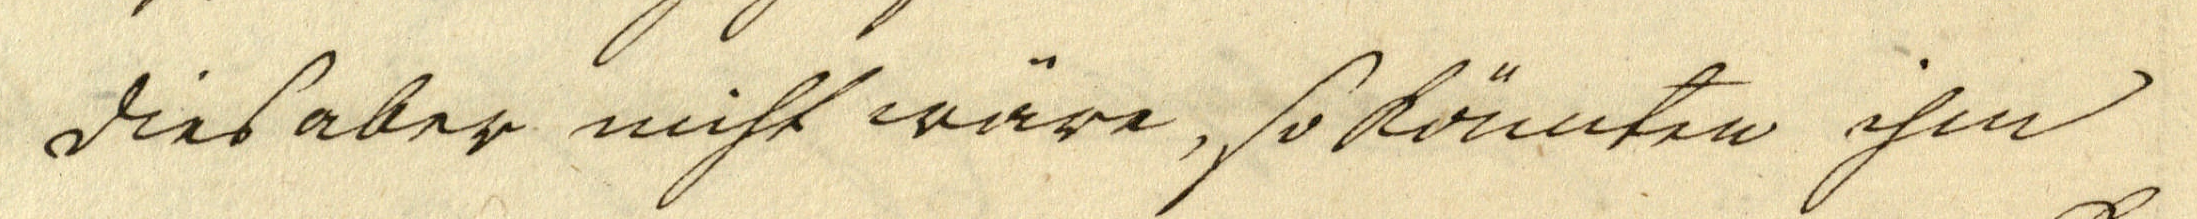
dies aber nicht wäre, so könnten ihm
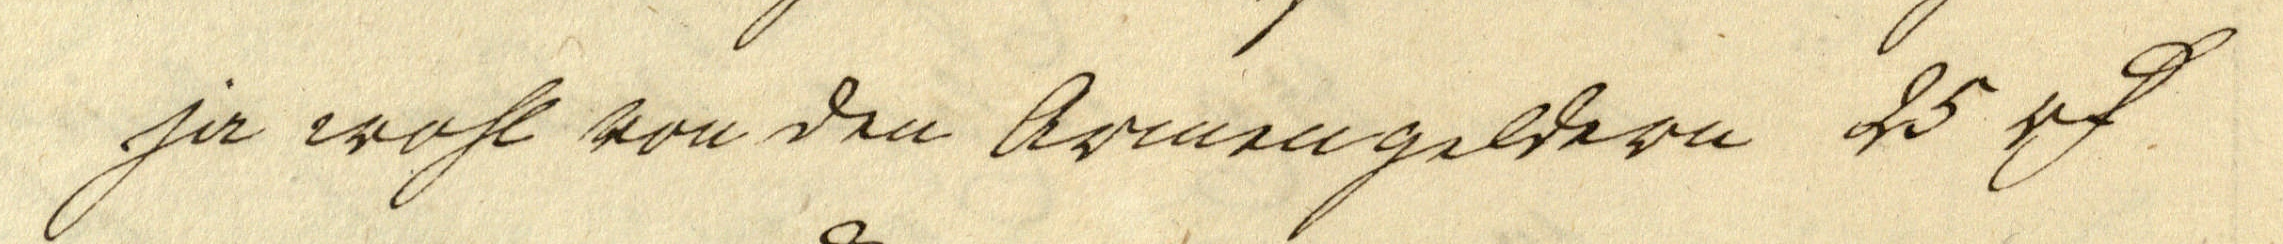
ja wohl von den Armengeldern 25 rtl.
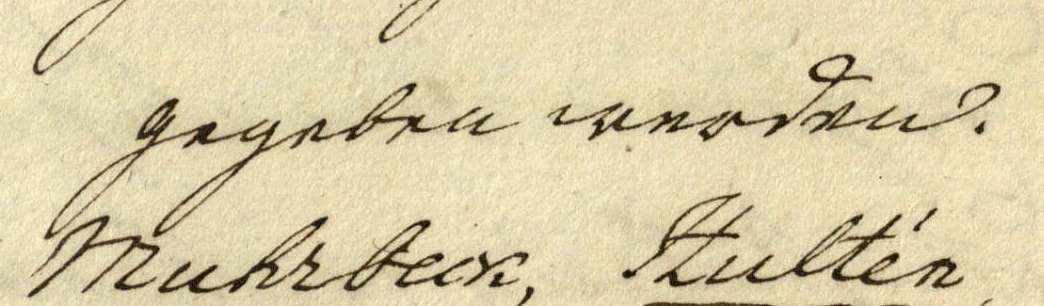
gegeben werden.
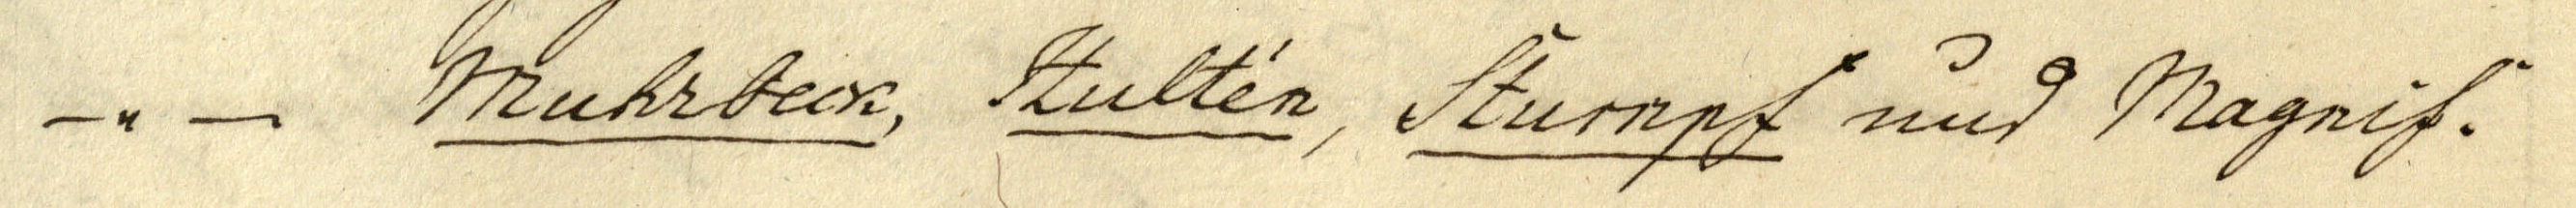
- " - Muhrbeck, Hultén, Stumpf und Magn.
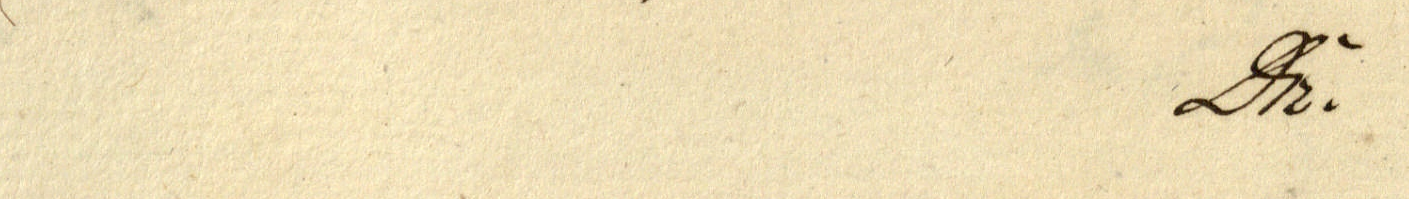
Dn.
